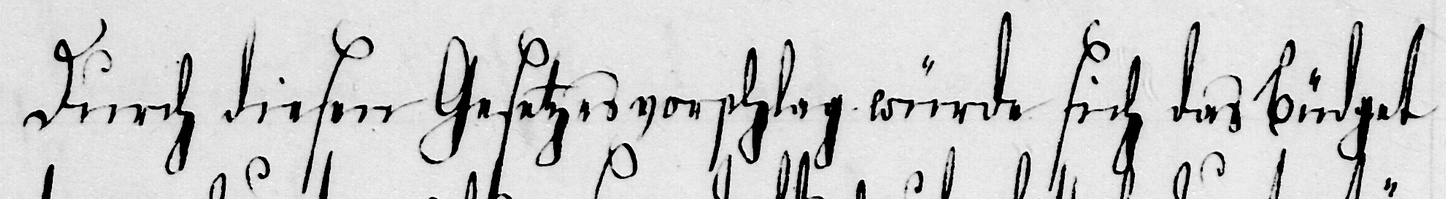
Durch diesen Gesetzesvorschlag würde sich das Büdget
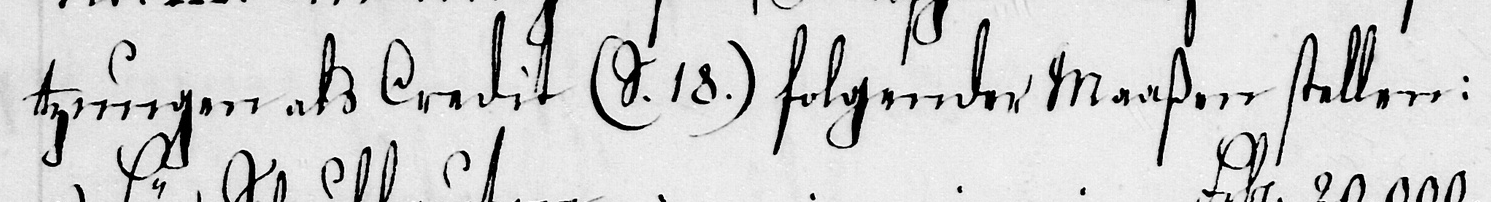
tzungen als Credit (S. 18.) folgender Maaßen stellen:
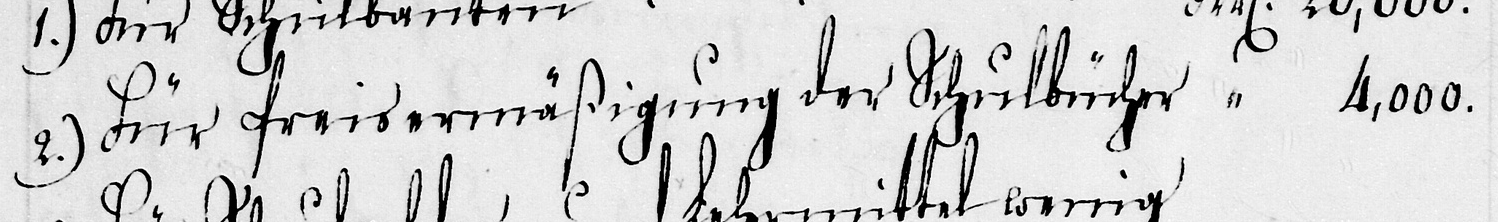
2.) Für Preisermäßigung der Schulbücher “ 4,000.
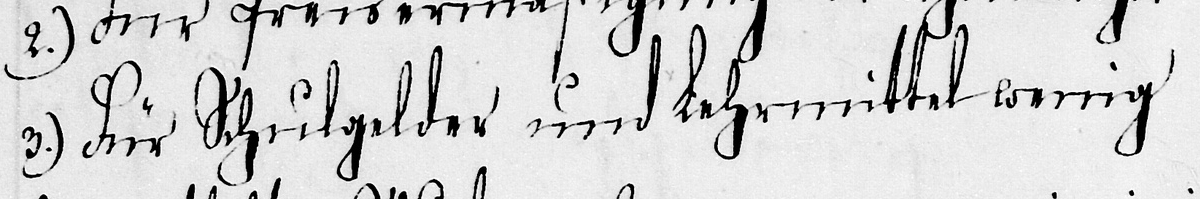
3.) Für Schulgelder und Lehrmittel wenig
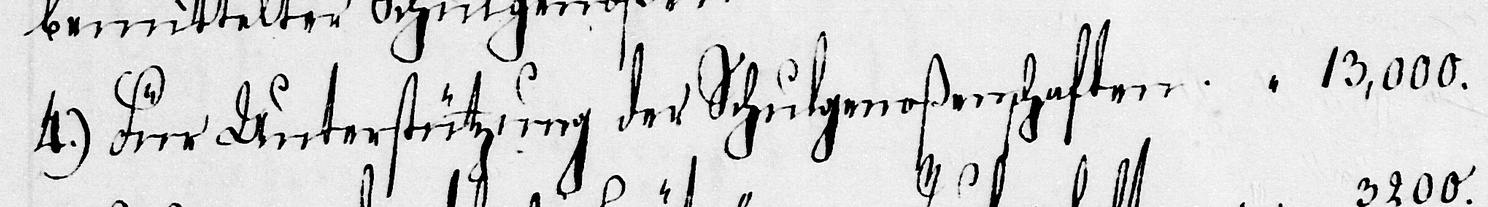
4.) Für Unterstützung der Schulgenoßenschaften “ 13,000.
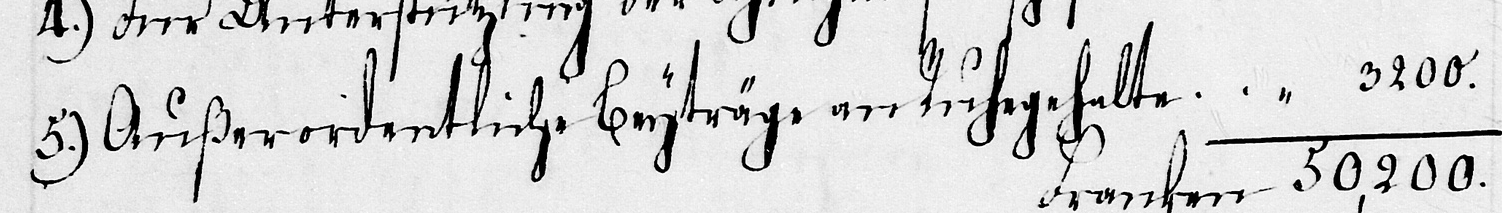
5.) Außerordentliche Beyträge an Ruhegehalte “ 3,200.
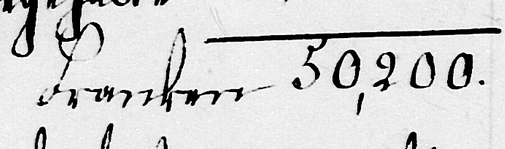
Franken 50,200.
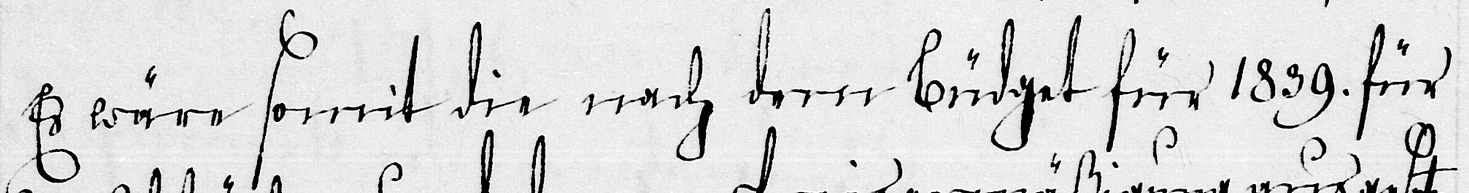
Es wäre somit die nach dem Büdget für 1839. für
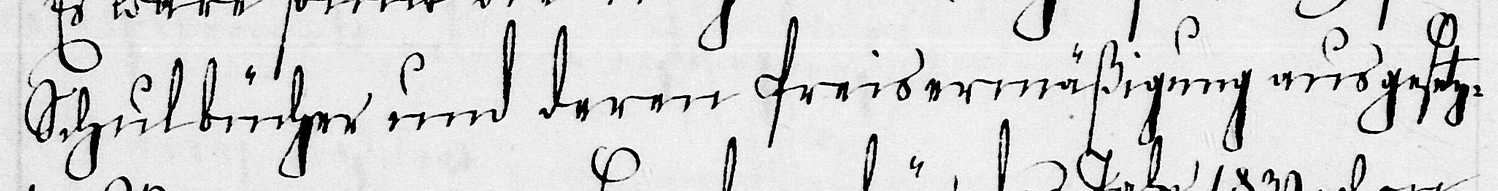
Schulbücher und deren Preisermäßigung ausgesetz¬
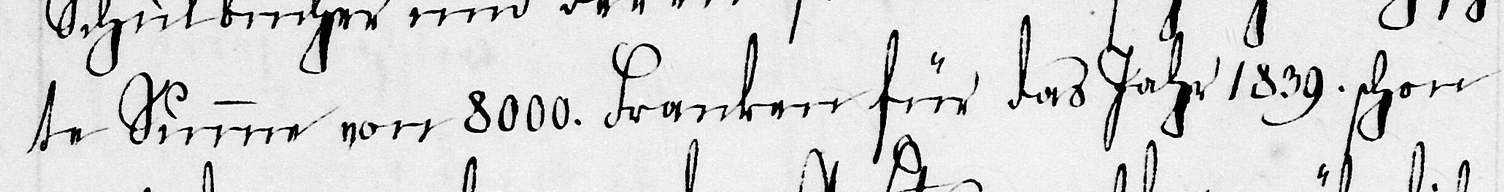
te Summe von 8000. Franken für das Jahr 1839. schon
